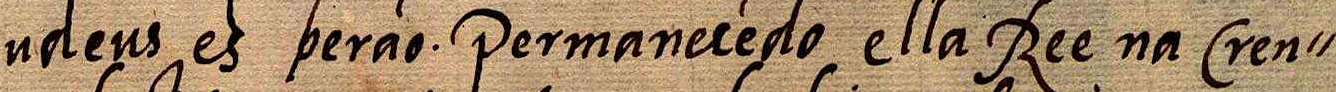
judeus esperaõ. Permanecēdo ella Ree na Cren
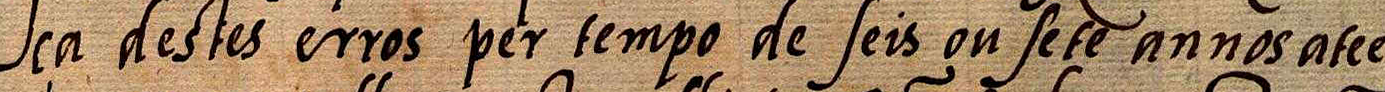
ça destes erros per tempo de seis ou sete annos atee
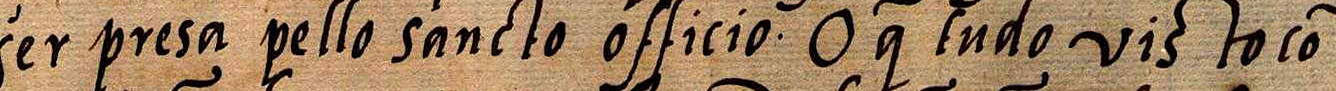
ser presa pello sancto officio. O q̄ tudo visto cō
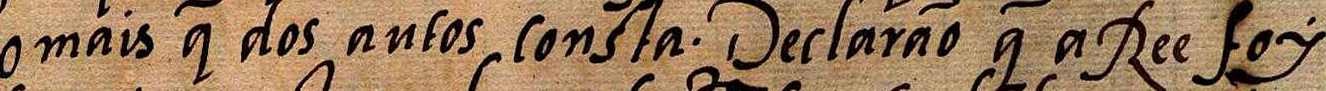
o mais q̄ dos autos consta. Declarão q̄ a Ree foy
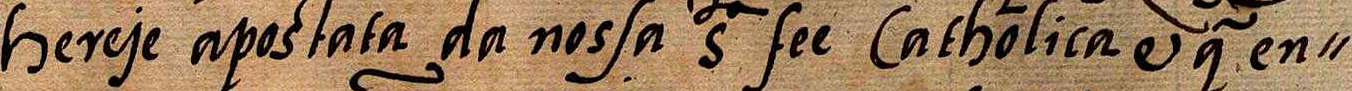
hereje apostata da nossa sta fee Catholica e q̄ en
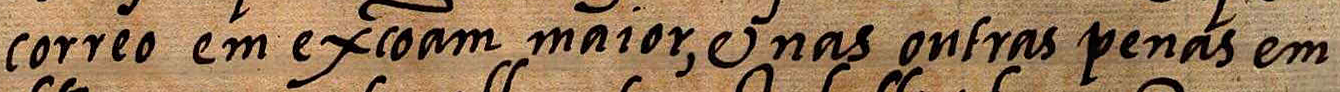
correo em excōam maior, e nas outras penas em
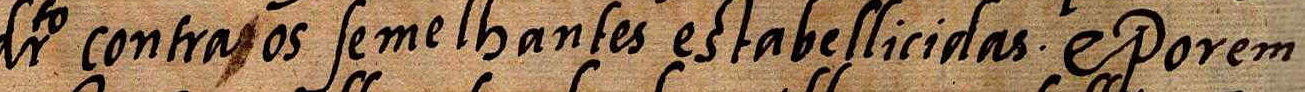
drto contra os semelhantes estabellicidas. E Porem
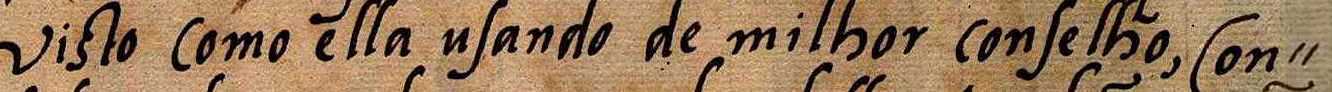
visto como ella usando de milhor conselho, Con
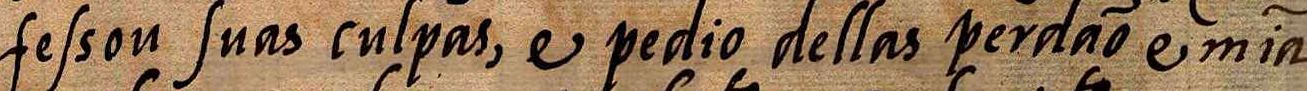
fessou suas culpas, e pedio dellas perdaõ e mīa
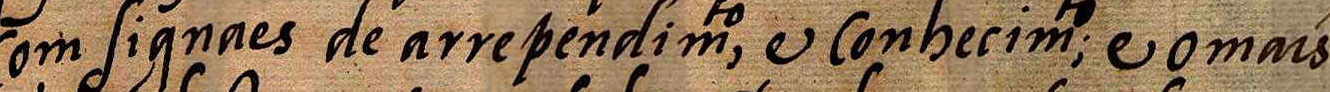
com signaes de arrependimto, e conhecimto; e o mais
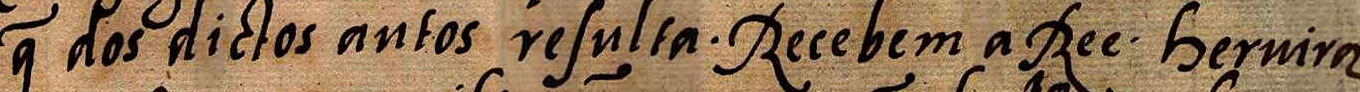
q̄ dos dictos autos resulta. Recebem a Ree. heruira
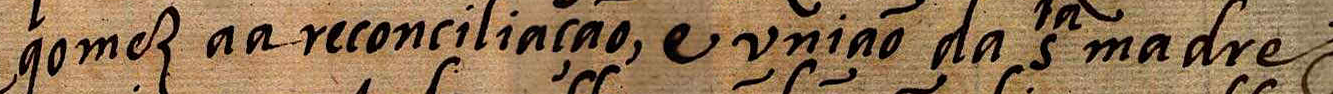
gomez aa reconciliaçaõ, e vniaõ da sta madre
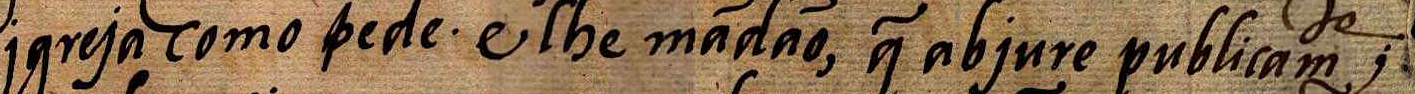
jgreja como pede. e lhe mādaõ, q̄ abjure publicamte
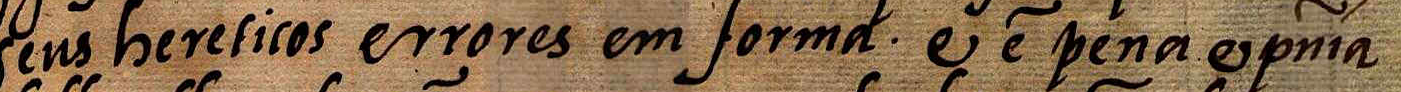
seus hereticos errores em forma. e ē pena e pn̄ia
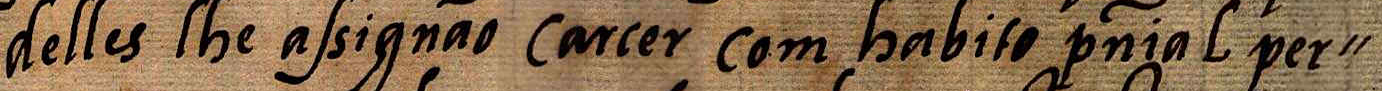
delles lhe assignão carcer com habito pn̄ial per
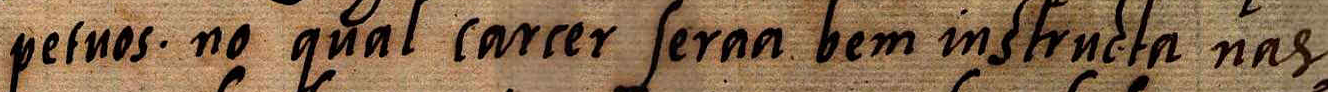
petuos. no qual carcer seraa bem instructa nas
